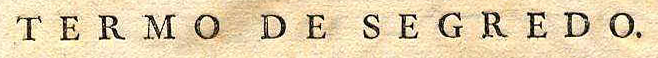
TERMO DE SEGREDO.
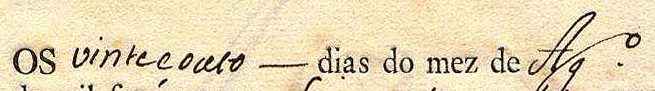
Os vinte, e outo - dias do mez de Ag.o
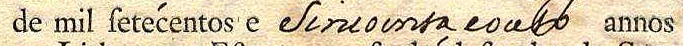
de mil setecentos e Sincoenta, e outto annos
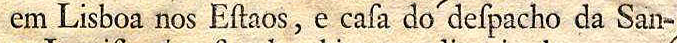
em Lisboa nos Estaos, e casa do despacho da San
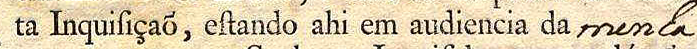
ta Inquisiçaõ, estando ahi em audiencia da menhã
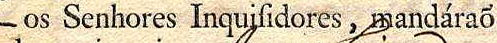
os Senhores Inquisidores, mandáraõ
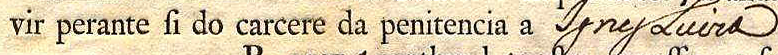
vir perante si do carcere da penitencia a Ignes Luiza
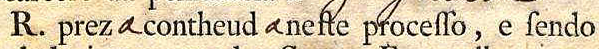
R. preza contheuda neste processo, e sendo
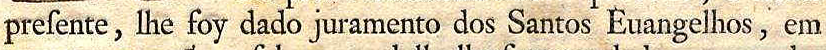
presente, lhe foy dado juramento dos Santos Euangelhos, em
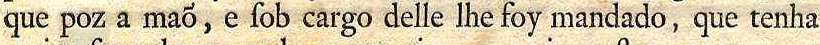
que poz a maõ, e sob cargo delle lhe foy mandado, que tenha
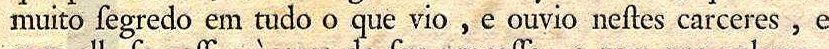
muito segredo em tudo o que vio, e ouvio nestes carceres, e
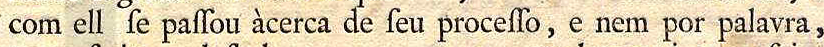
com ell se passou àcerca de seu processo, e nem por palavra,
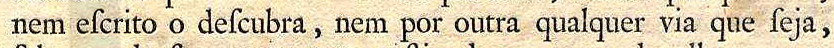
nem escrito o descubra, nem por outra qualquer via que seja,
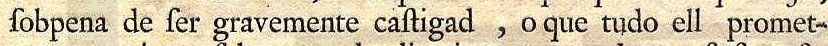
sob pena de ser gravemente castigad, o que tudo ell promet
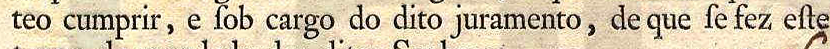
teo cumprir, e sob cargo do dito juramento, de que se fez este
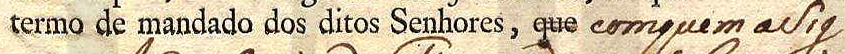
termo de mandado dos ditos Senhores, que com quem asig
